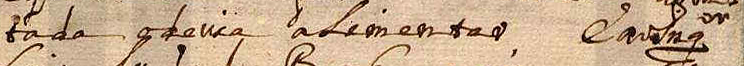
tada o deuia aLimentar E ao inq.or
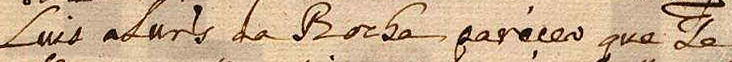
Luis aLurs̄ da Rocha pareçeo que se
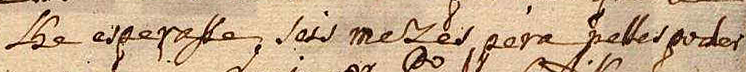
lhe esperasse seis mezes pera nelles poder
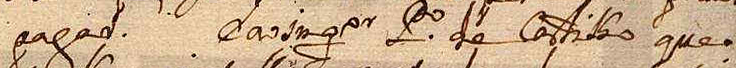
pagar. E ao inqor P.o de Castilho que
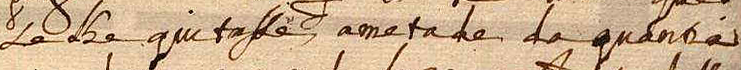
se lhe quitasse a metade da quantia
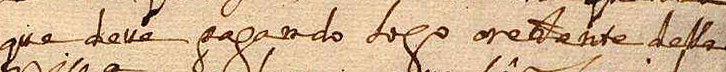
que deue pagando logo o restante della
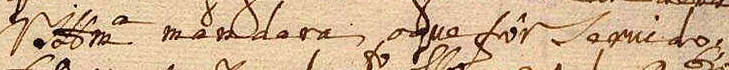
V Illm.a mandara, o que fôr seruido.
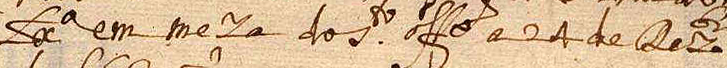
Lx.a em meza do s.to off.o a 24 de Dezbro
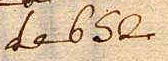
de 652.
